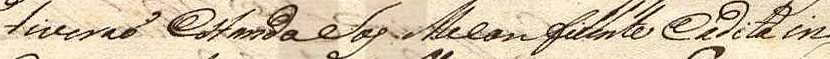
tiveraõ estando sos elle confitente e a dita in
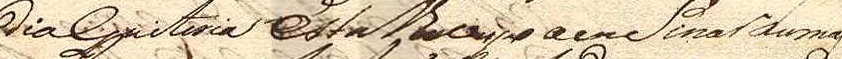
dia Quiteria esta lhe ueyo a enSinar humas
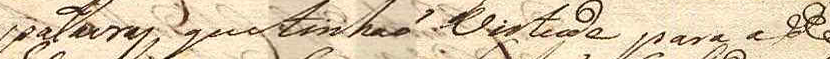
palavras que tinhaõ Uirtude para ade
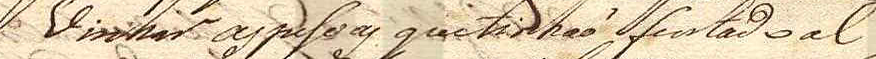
Vinhar as pessoas que tinhaõ furtado al
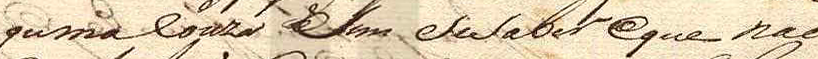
guma couza Sem se saber E que naõ
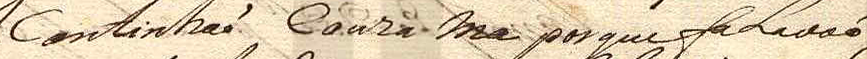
Continhaõ Couza ma porque falavaõ
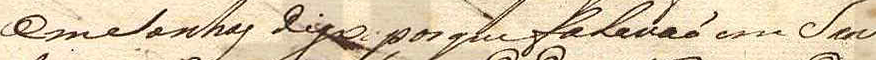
em Sonhos digo porque falavaõ em san
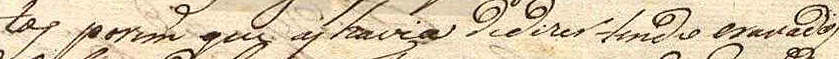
tos porem que as havia de dizer tendo cravados
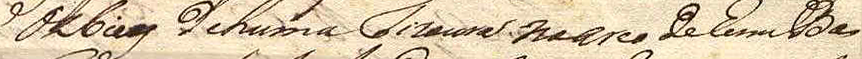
Oz bicos de huma Tizoura no arco de hum Ba
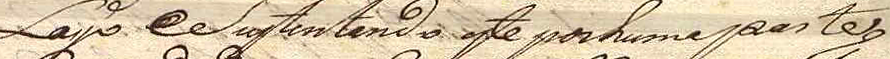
Layo e Sustentando este por huma parte
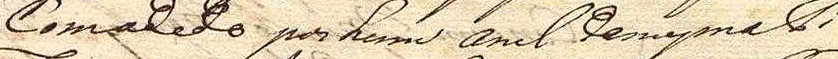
Com o dedo por hum anel de mesma Ti
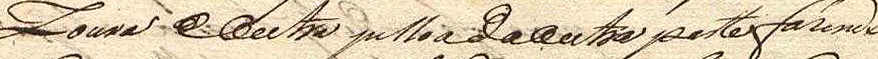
Zoura e Outra pessoa da outra parte fazendo
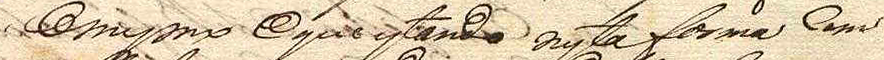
O mesmo E que estando nesta forma com
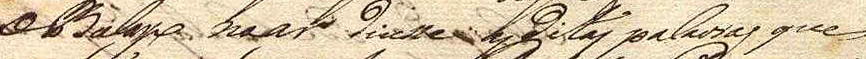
o Balayo no ar dicesse as ditas palavras que
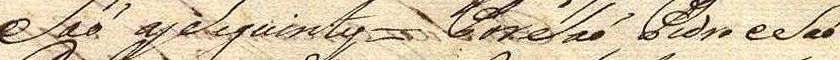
Saõ as seguintes= Por Saõ Pedro e Saõ
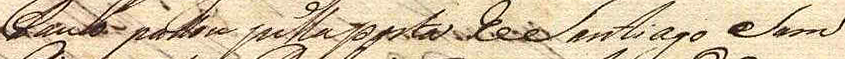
Paulo passou pella porta E Santiago Sam
